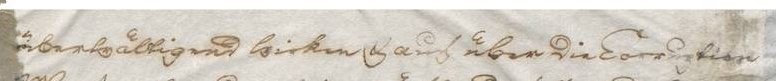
überwältigend wirken & auch über die Corruption
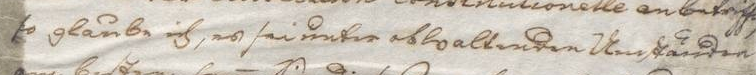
so glaube ich, es sei unter obwaltenden Umständen
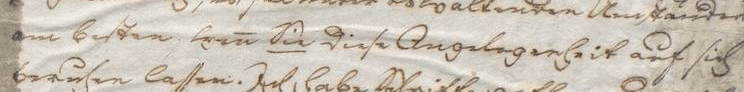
am besten, wenn Sie diese Angelegenheit auf sich
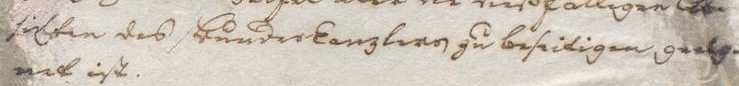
sichten des Bundeskanzlers zu beseitigen geeig-
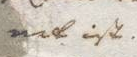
net ist.
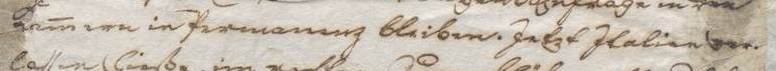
Kammern in Permanenz bleiben. Jetzt Italien ver-
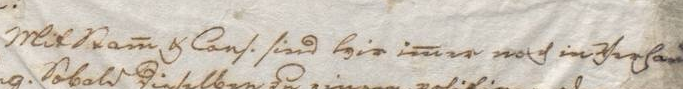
Mit Stamm & Cons. sind wir immer noch in Verhand-
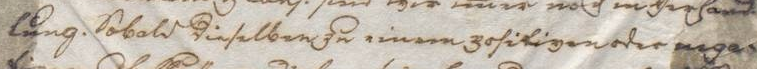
lung. Sobald dieselben zu einem positiven oder nega-
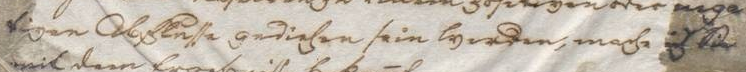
tiven Abschlusse gediehen sein werden, mache ich Sie
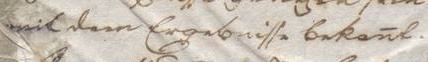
mit dem Ergebnisse bekannt.
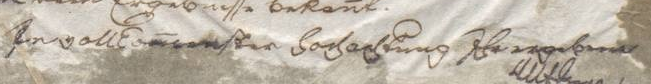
In vollkommenster Hochachtung Ihr ergebene
